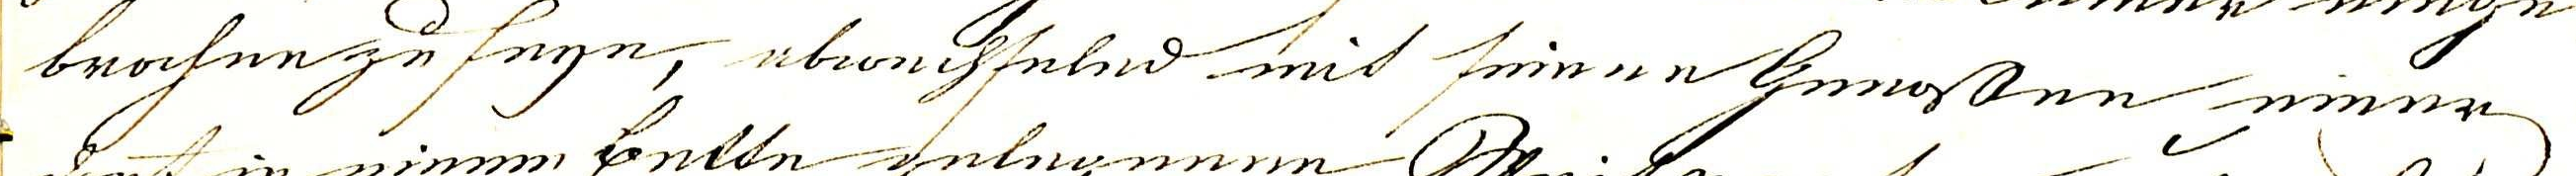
brochen zu seyn, abwechselnd mit seinen Genoßen einer
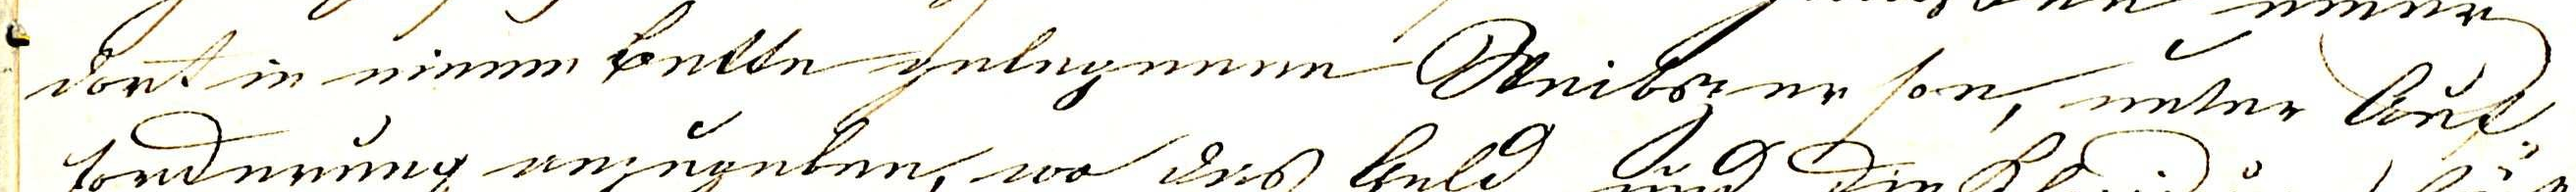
dort in einem Bette gelegenen Weibsperson, unter Auf¬
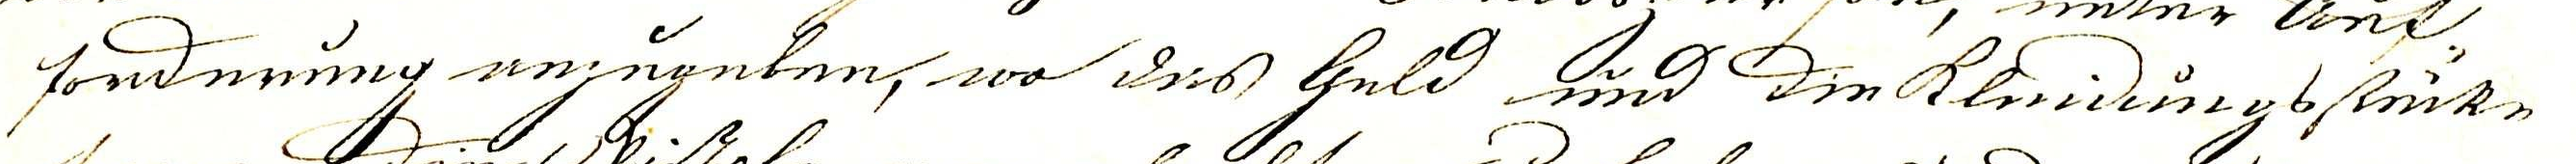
forderung anzugeben, wo das Geld und die Kleidungsstücke
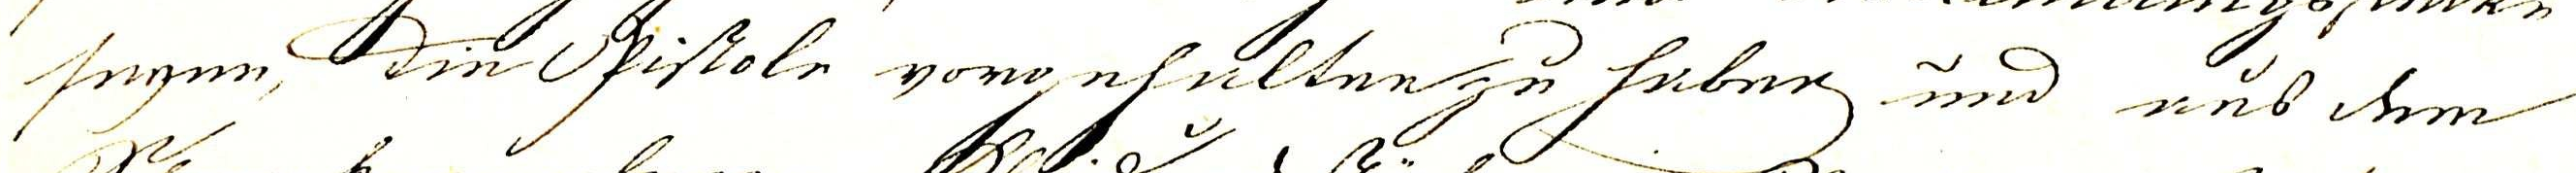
seyen, die Pistole vorgehalten zu haben und aus dem
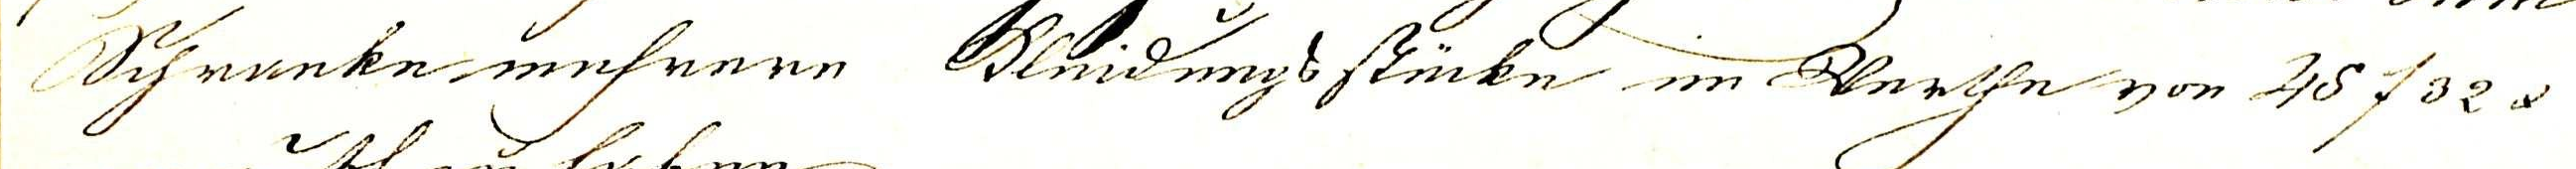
Schranke mehrere Kleidungsstücke im Werthe von 45f 32 x
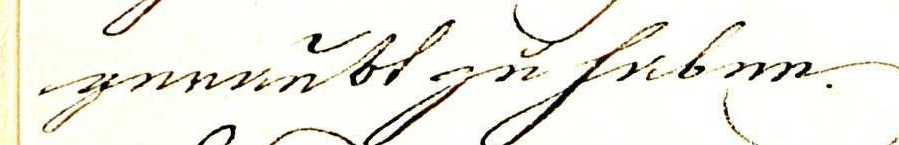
geraubt zu haben.
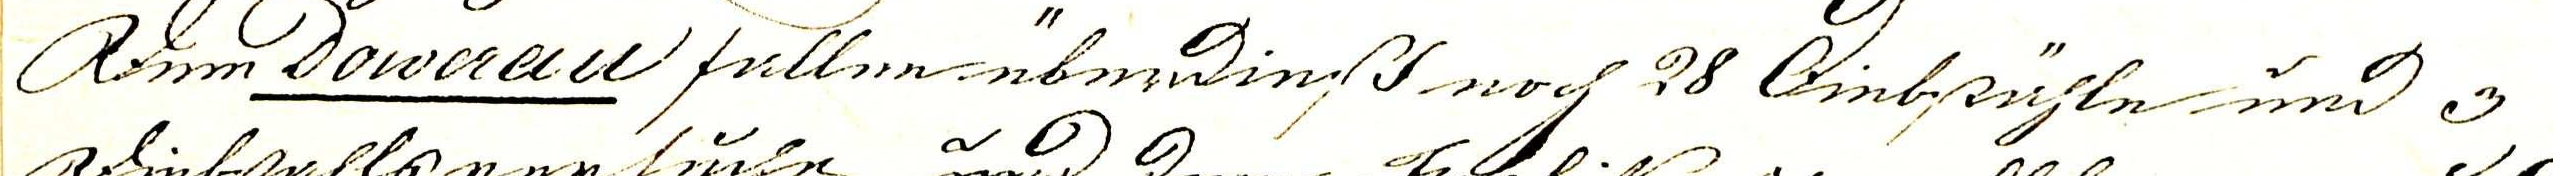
Dem Dowerau fallen überdieß noch 28 Diebstähle und 3
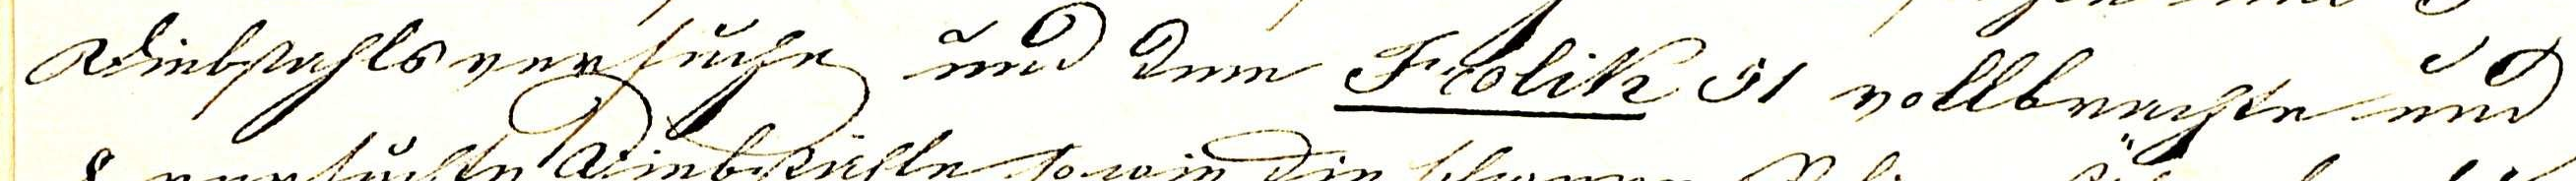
Diebstahslversuche und dem Frolik 31 vollbrachte und
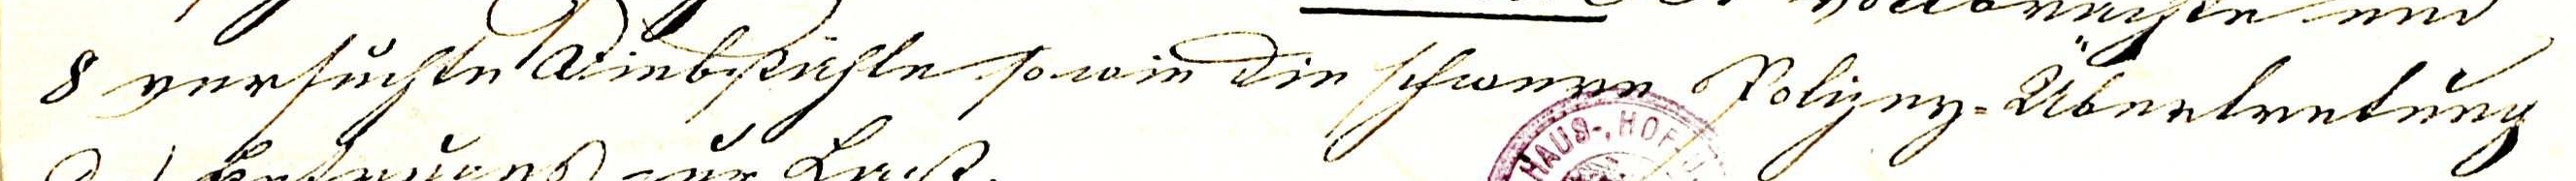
8 versuchte Diebstähle so wie die schweren Polizey-Übertretung
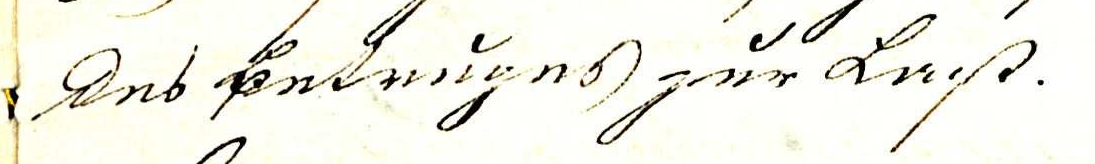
des Betruges zur Last.
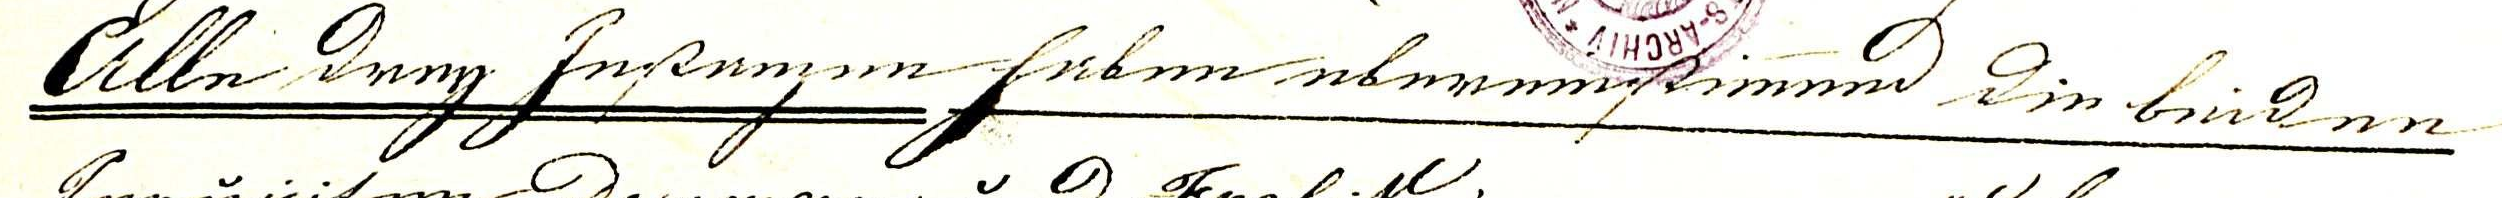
Alle drey Instanzen haben übereinstimmend die beiden
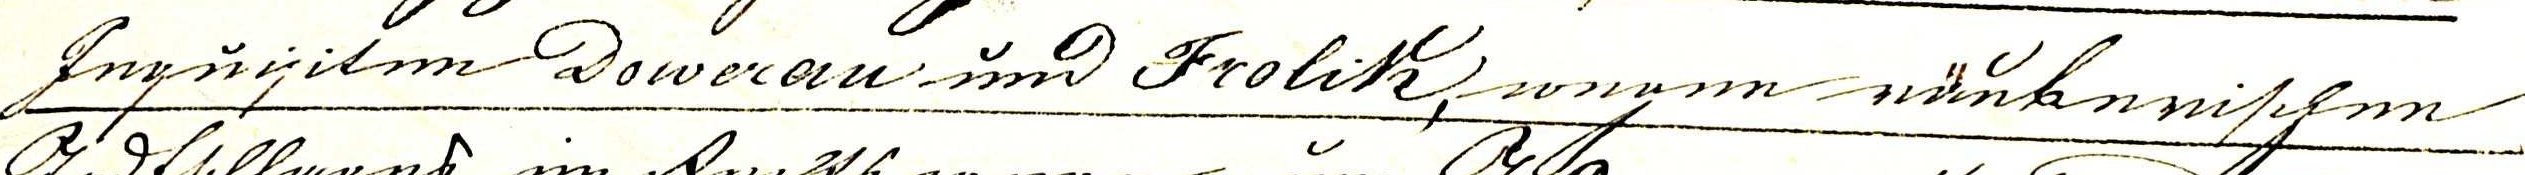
Inquisiten Dowerau und Frolik, wegen räuberischen
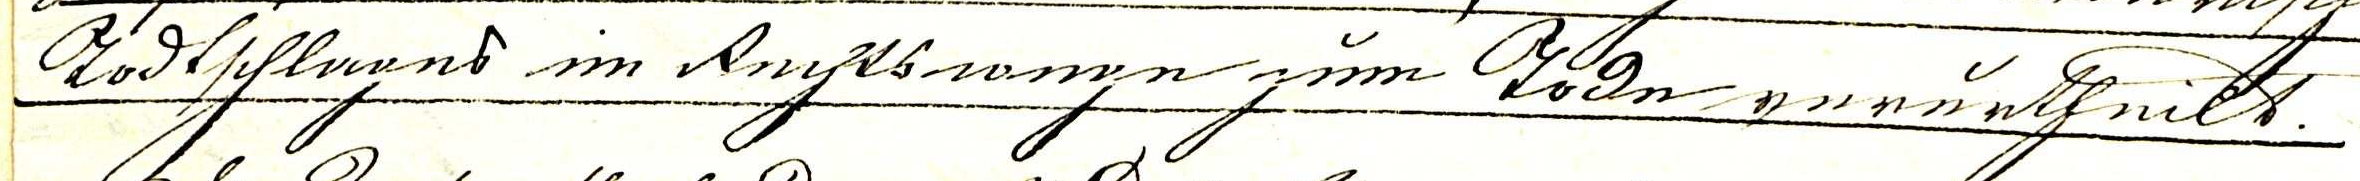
Todtschlages im Rechtswege zum Tode verurtheilt.
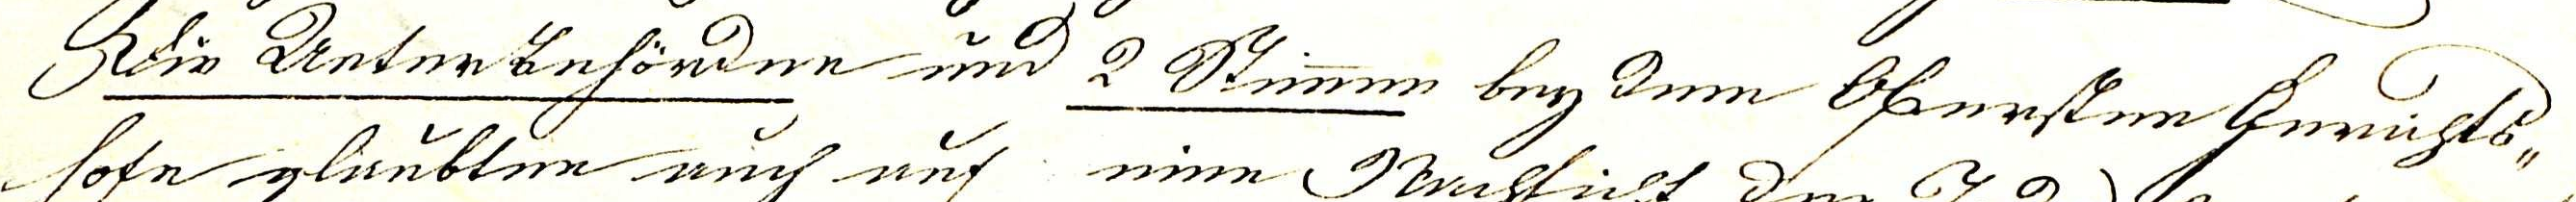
Die Unterbehörden und 2 Stimmen bey dem Obersten Gerichts¬
